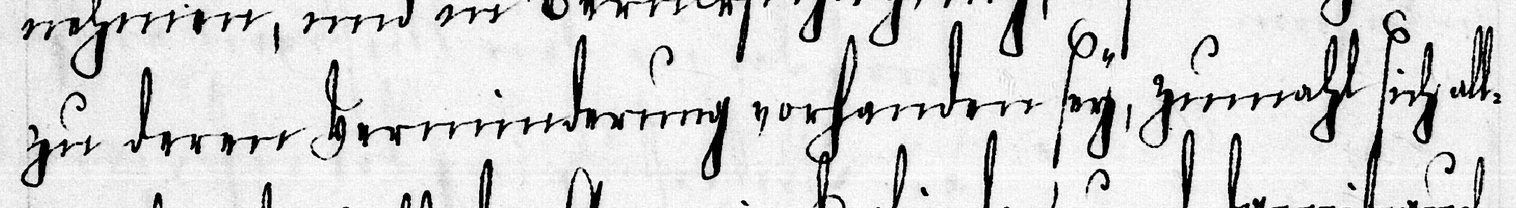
zu deren Verminderung vorhanden sey, zumahl sich al¬
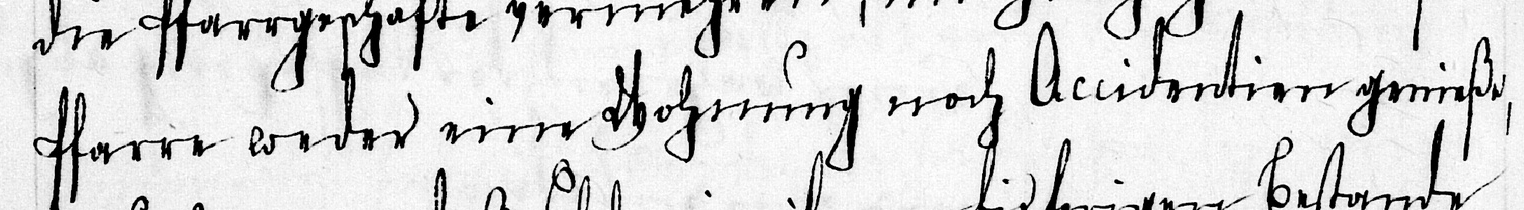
Pfarre weder eine Wohnung noch Accidentien genieße,
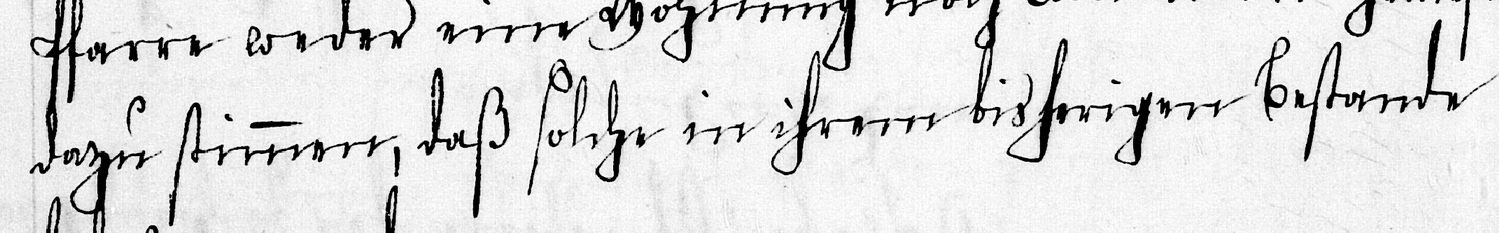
dazu stimmen, daß solche in ihrem bisherigen Bestande
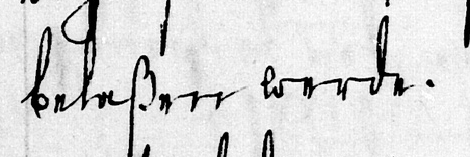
belaßen werde.
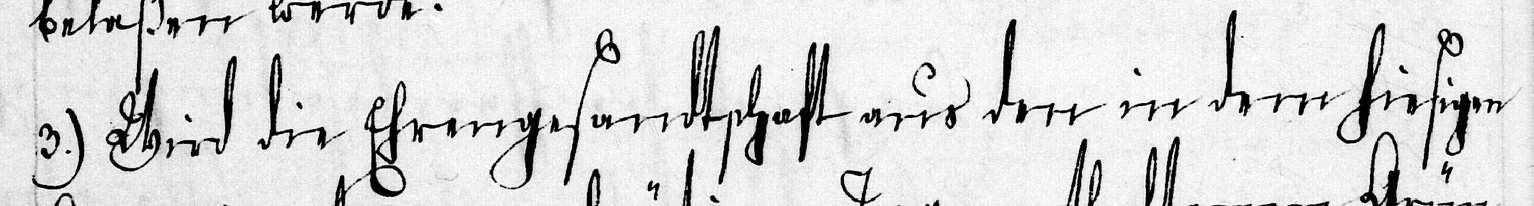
3.) Wird die Ehrengesandtschaft aus den in dem hiesigen
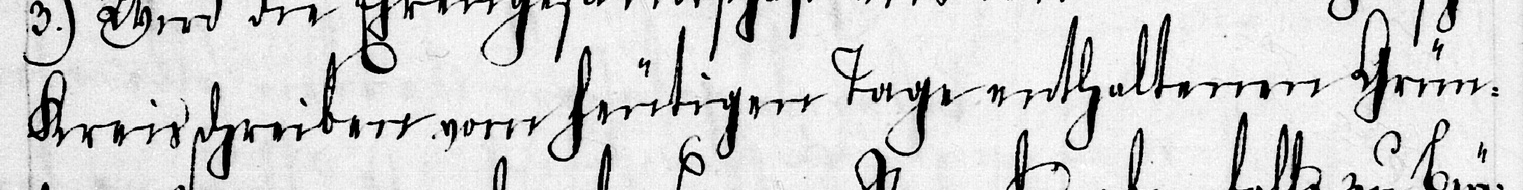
Kreisschreiben vom heutigen Tage enthaltenen Grün¬
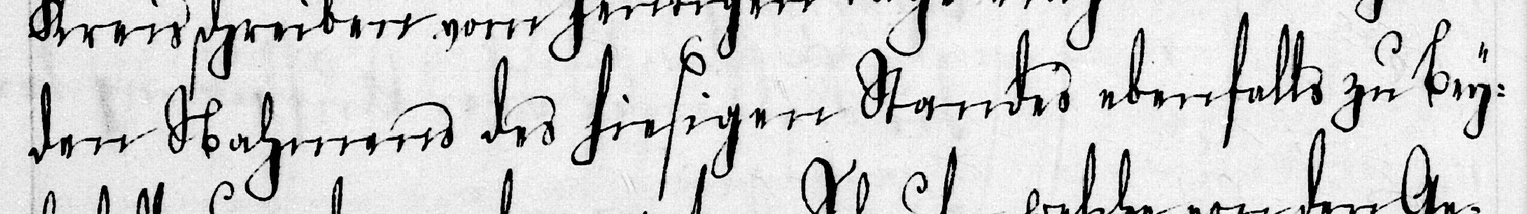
den Nahmens des hiesigen Standes ebenfalls zu Bey¬
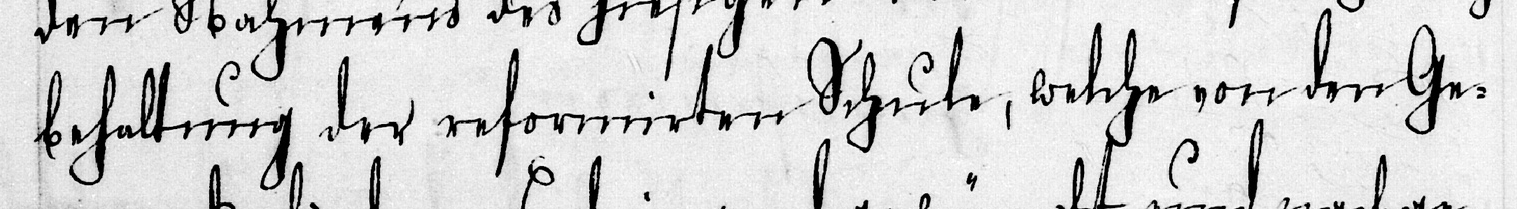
behaltung der reformirten Schule, welche von den Ge¬
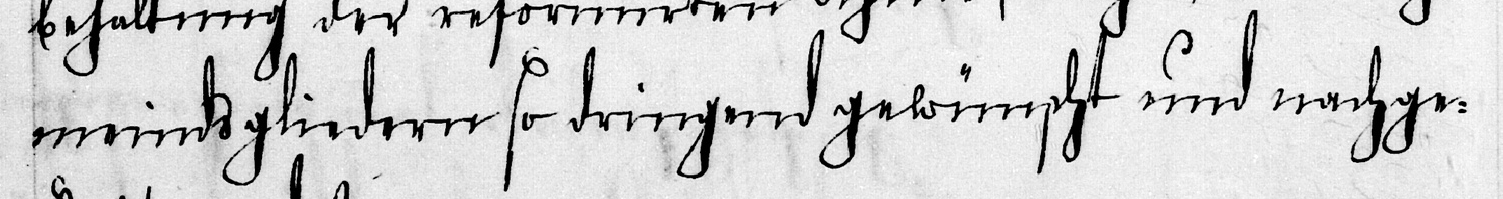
meindsgliedern so dringend gewünscht und nachge¬
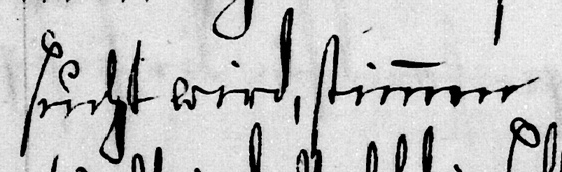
sucht wird, stimmen.
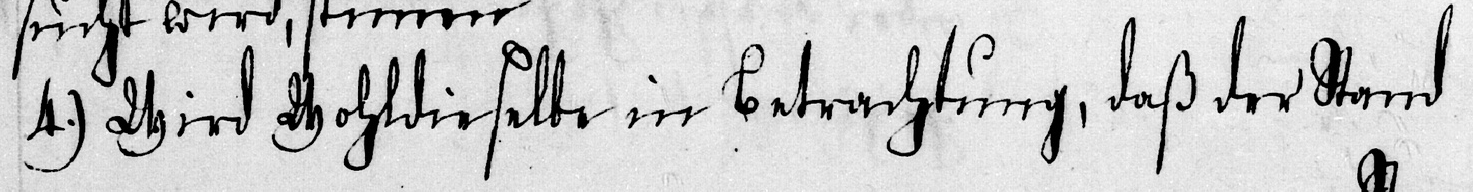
4.) Wird Wohldieselbe in Betrachtung, daß der Stand
